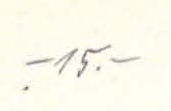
15.
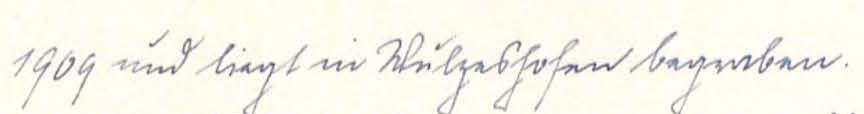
1909 und liegt in Wulzeshofen begraben.
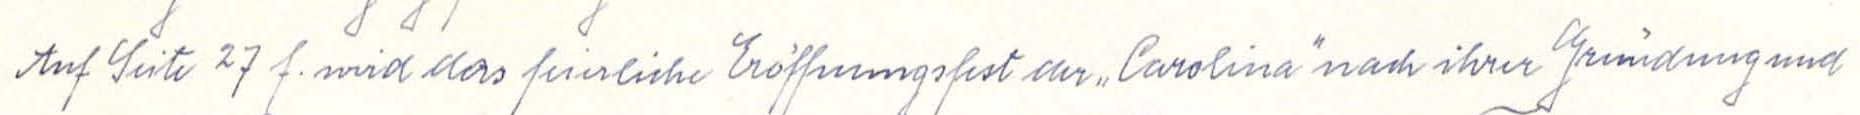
Auf Seite 27 f. wird das feierliche Eröffnungsfest der "Carolina" nach ihrer Gründung und
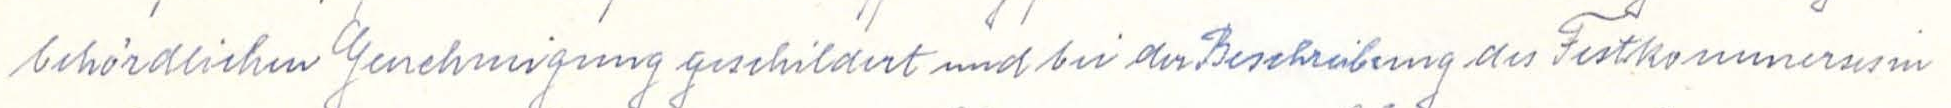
behördlichen Genehmigung geschildert und bei der Beschreibunf des Festkommerses in
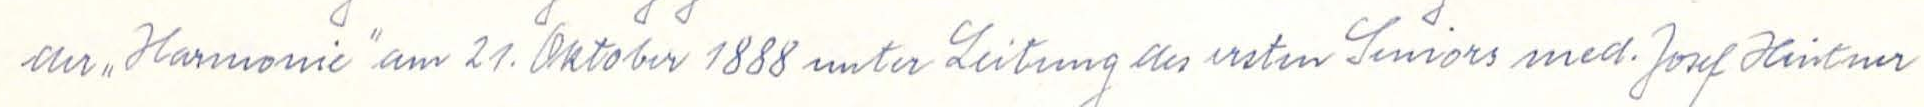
der "Harmonie" am 21. Oktober 1888 unter Leitung des ersten Seniors med. Josef Hintner
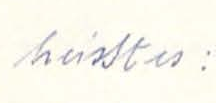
heisst es:
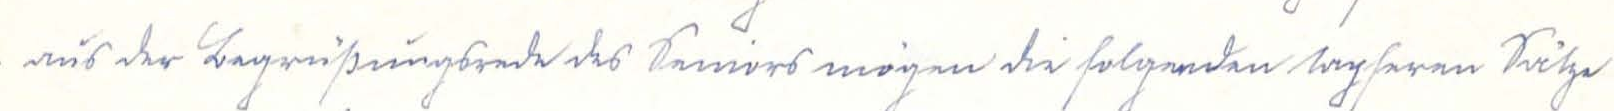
aus der Begrüßungsrede des Seniors mögen die folgenden tapferen Satze
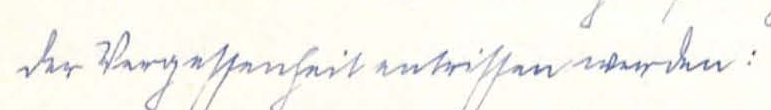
der Vergangenheit entrissen werden:
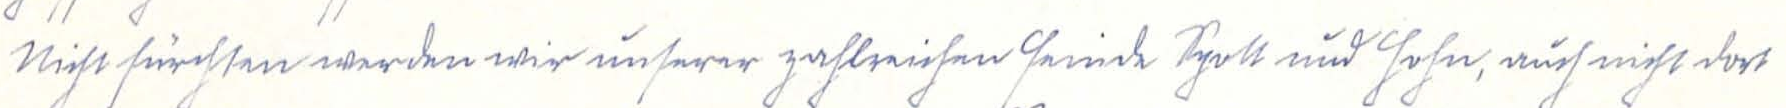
Nicht fürchten werden wir unserer zahlreichen Feinde Spott und Hohn, auch nicht dort
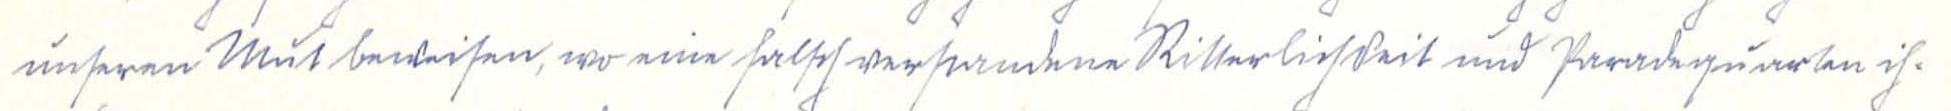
unseren Mut beweisen, wo eine falsch verstandene Ritterlichkeit und Parade[...] ih-
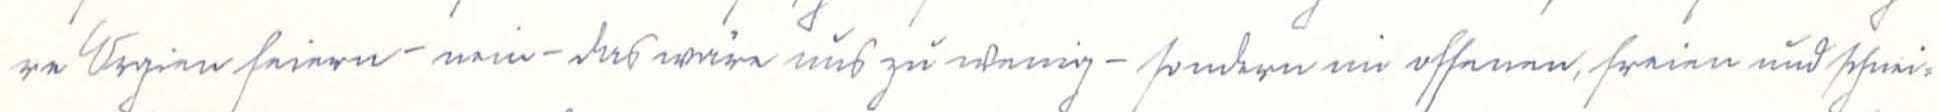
re Orgien feiern - nein - das wäre uns zu wenig - sondern wir offenen, freien und schnei-
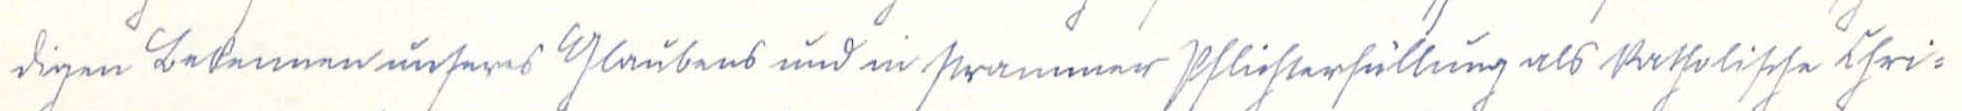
digen Bekenner unseres Glaubens und in strammer Plichterfüllung als katholische Chri-
